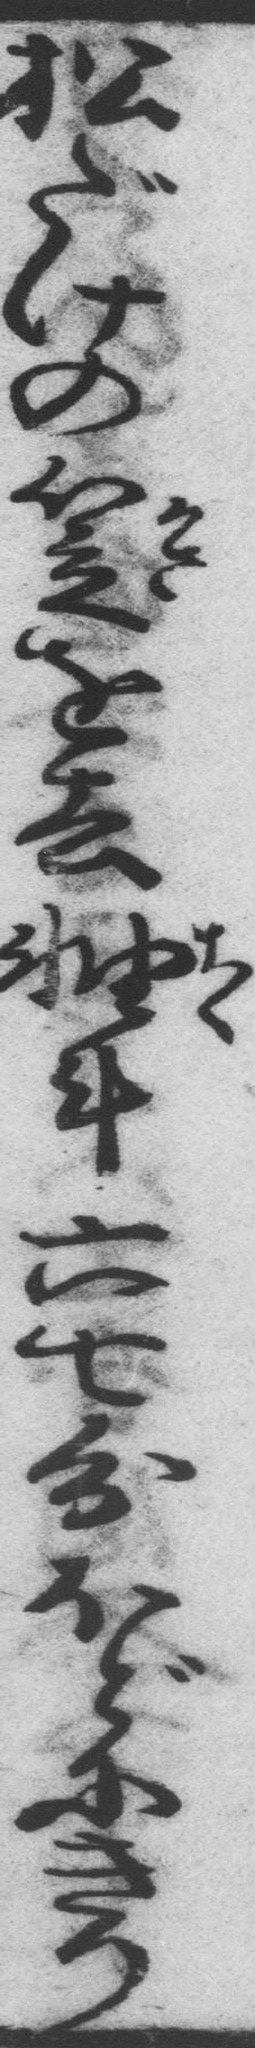松だけの笠を去軸斗六七分ほどにきり
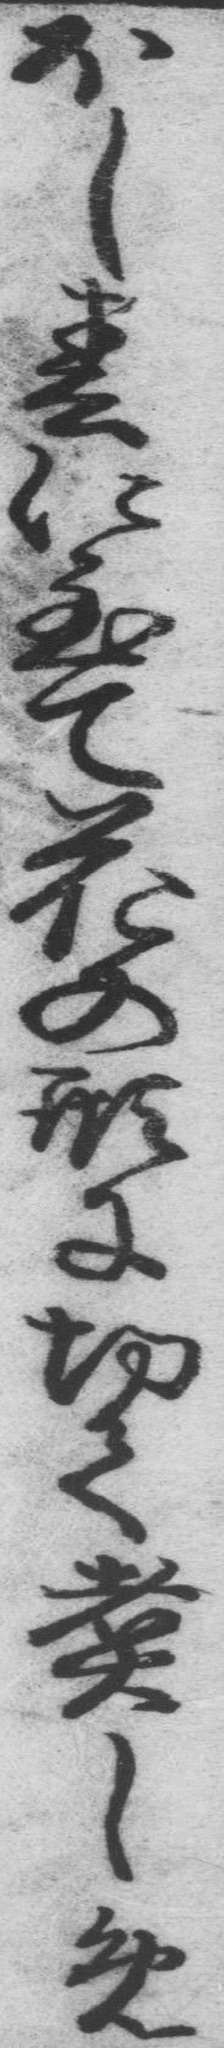ほし春に至て花の形に切て煮しめ
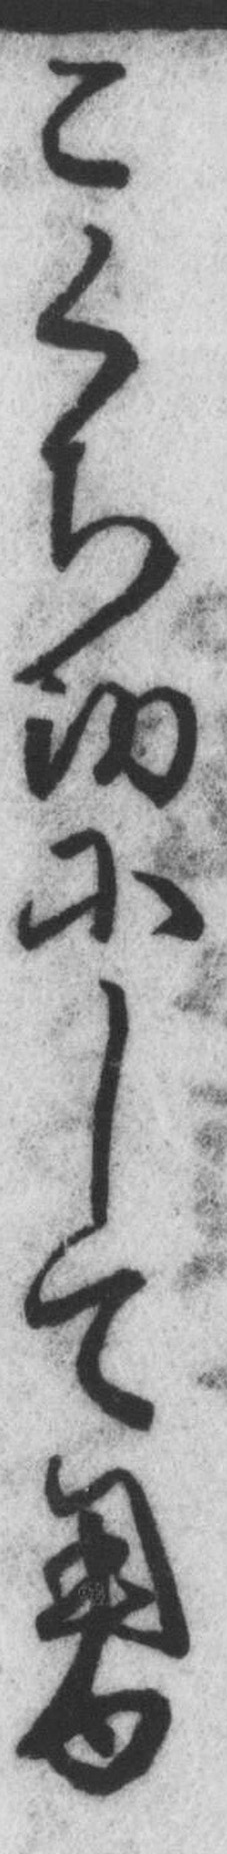こくち切にして用ゆ
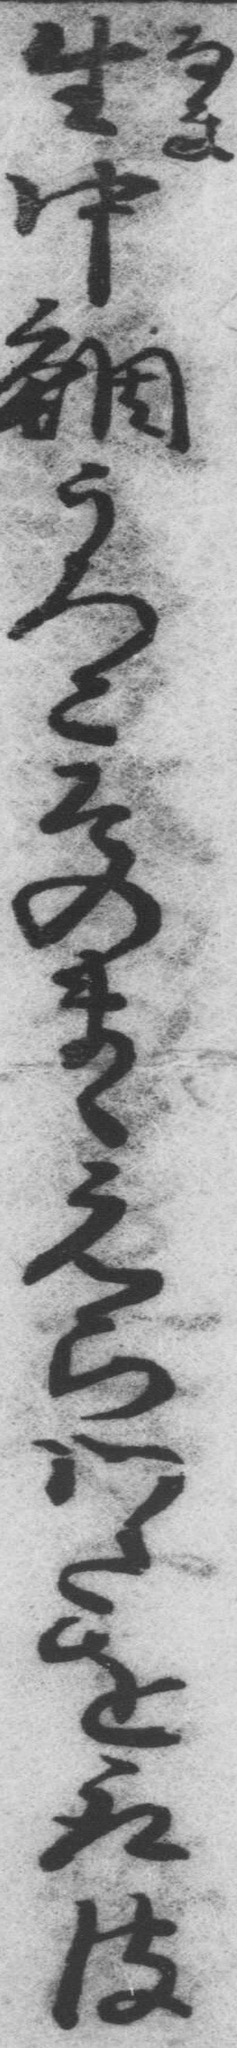生中鯛うろこそのまゝえらわたを取り皮
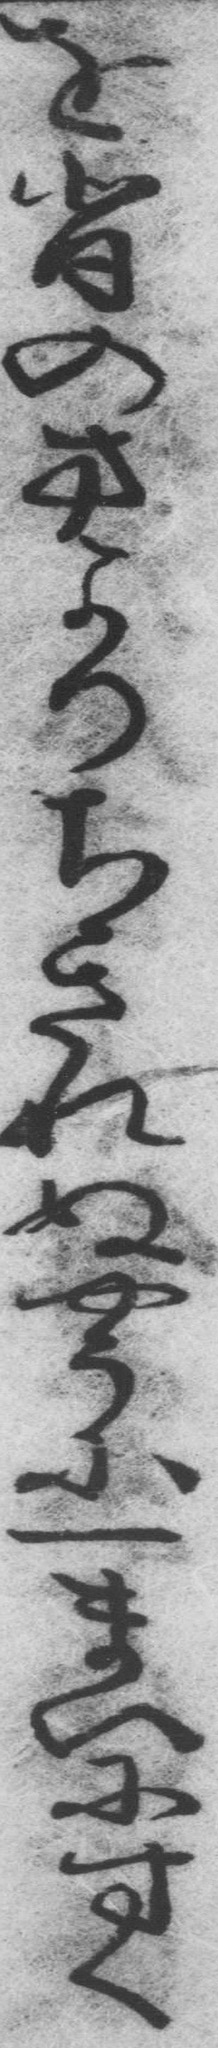を背の方よりちきれぬやうに一まいにすく
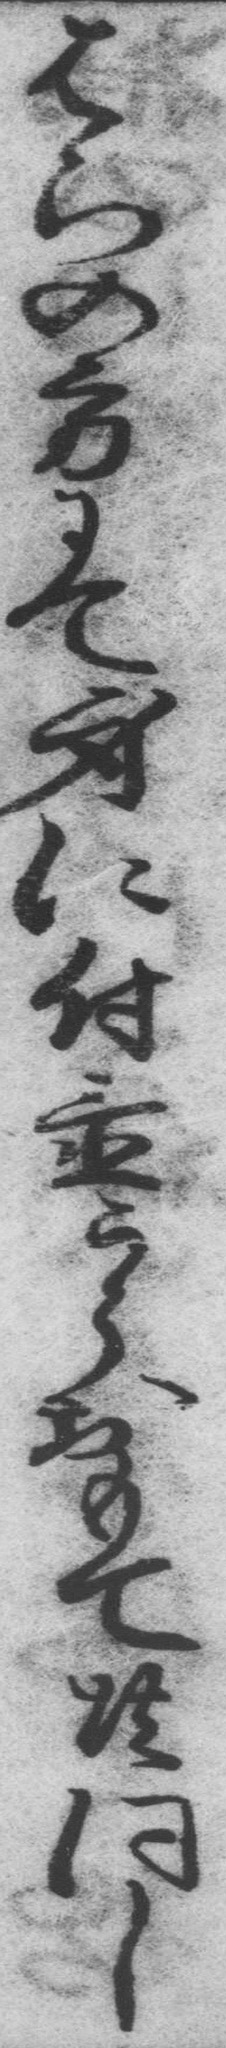はらの方にて身に付置うらおもて共同し
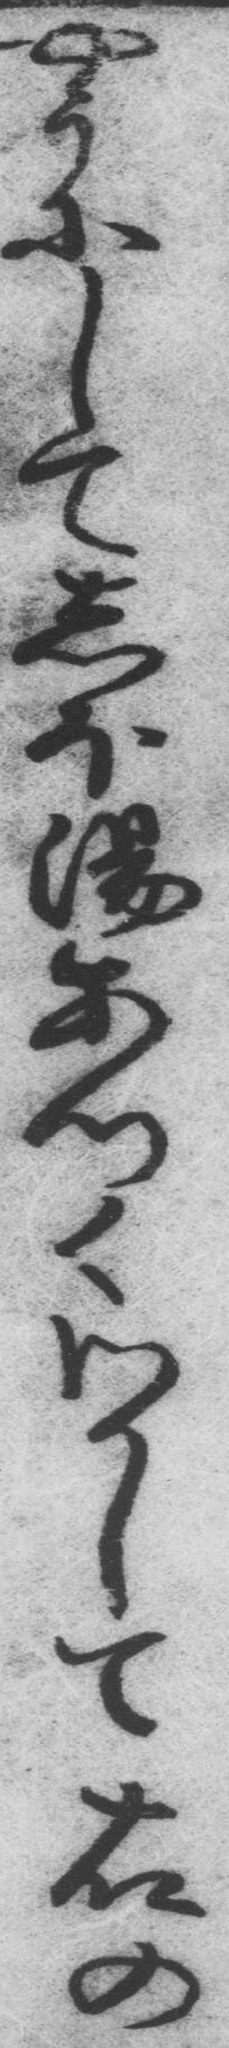やうにしてしほ湯あつくわかして右の
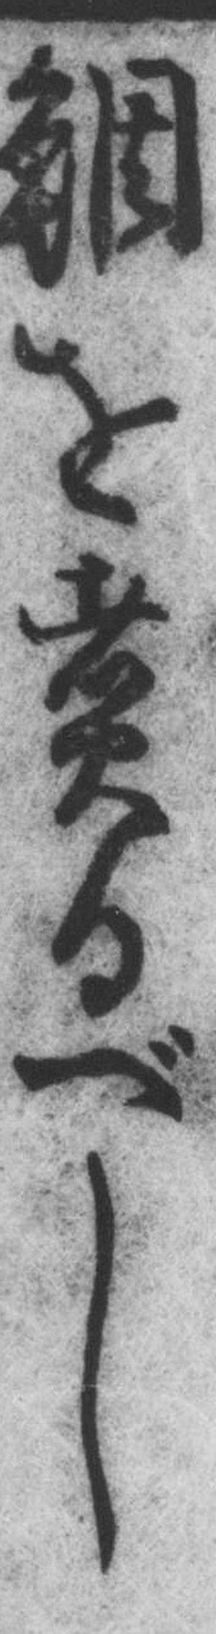鯛を煮るべし

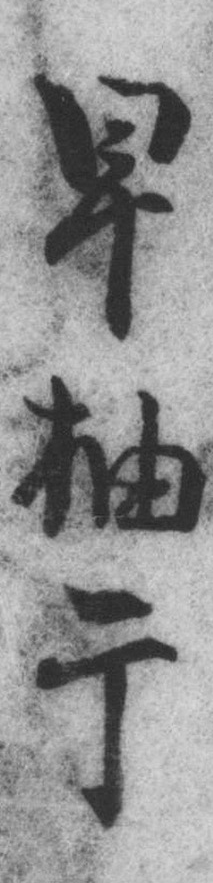早柚干
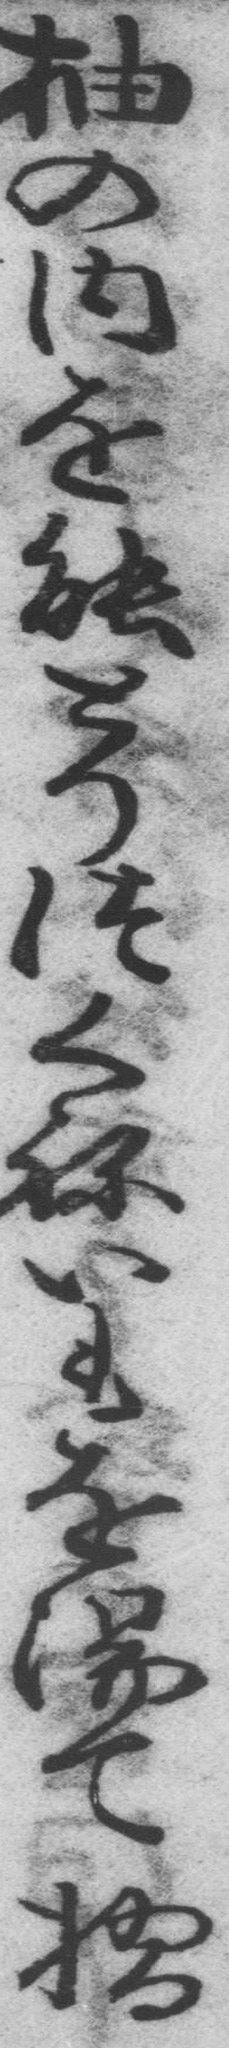柚の内を能とりつくねいもを湯て摺
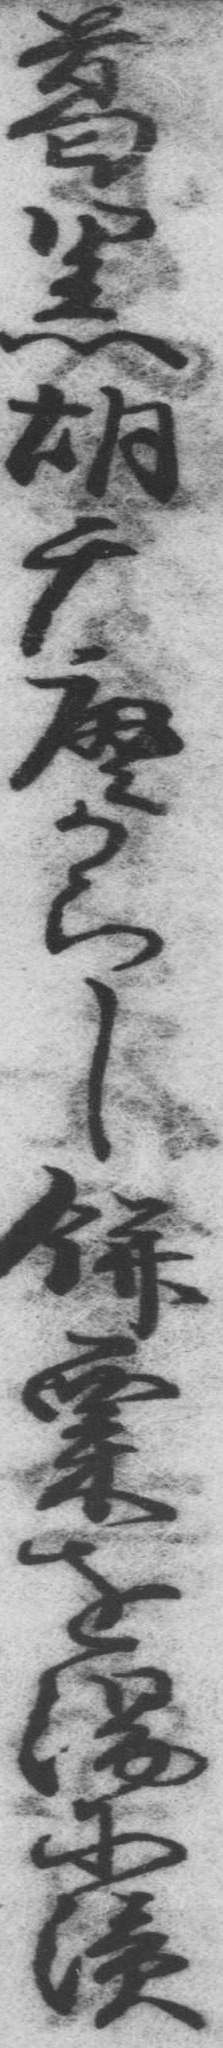葛黒胡麻唐からし餅粟を湯に漬
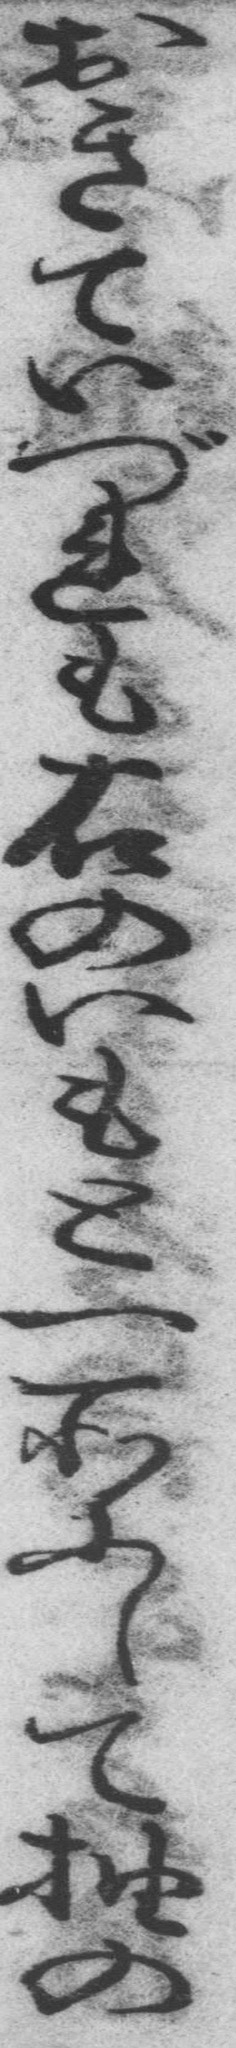おきていづれも右のいもと一所にして柚の
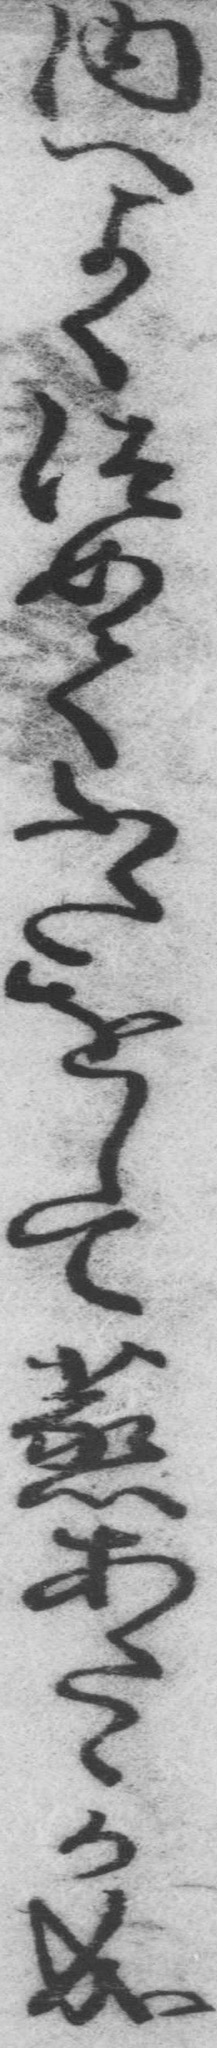内へよくつめてふたをして蒸あたゝか成
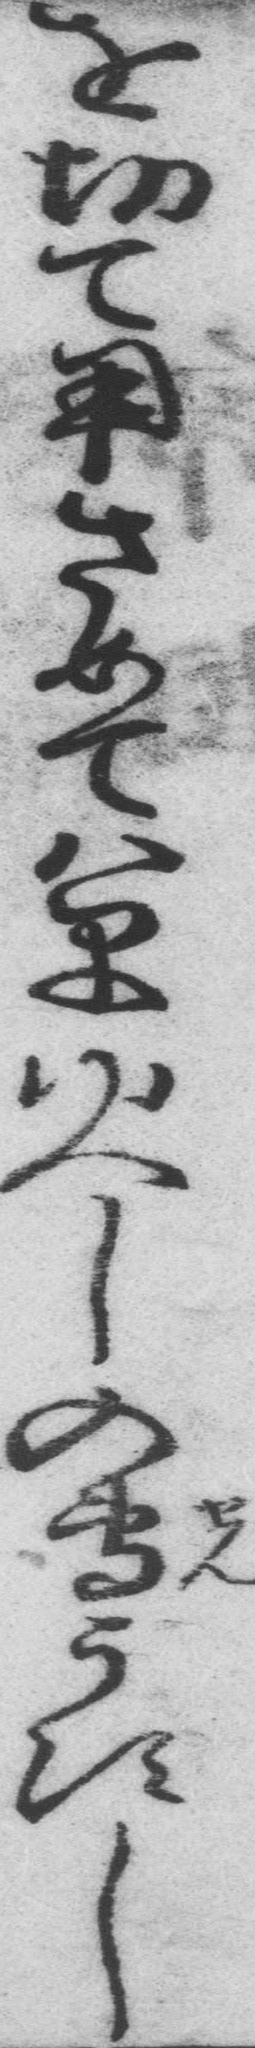を切て用さめては早ゆへしの専うすし
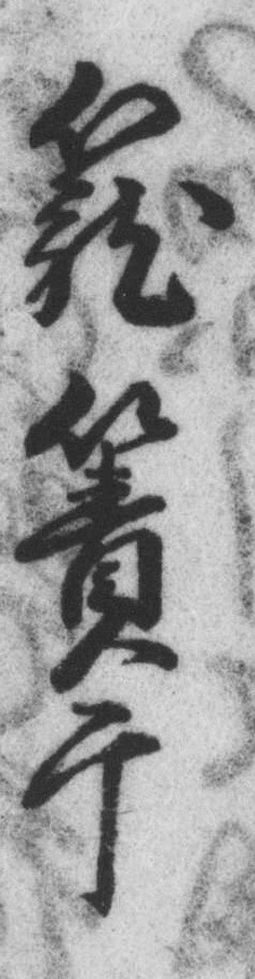籠簀干
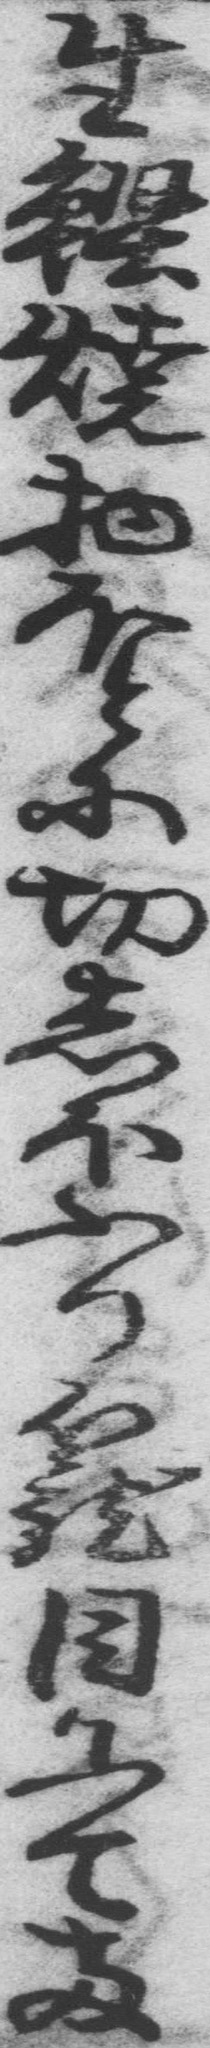生鰹焼物ほとに切しほふり籠目にて両
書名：料理山海郷
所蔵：大阪府立大学学術情報センター 国文学研究資料館
